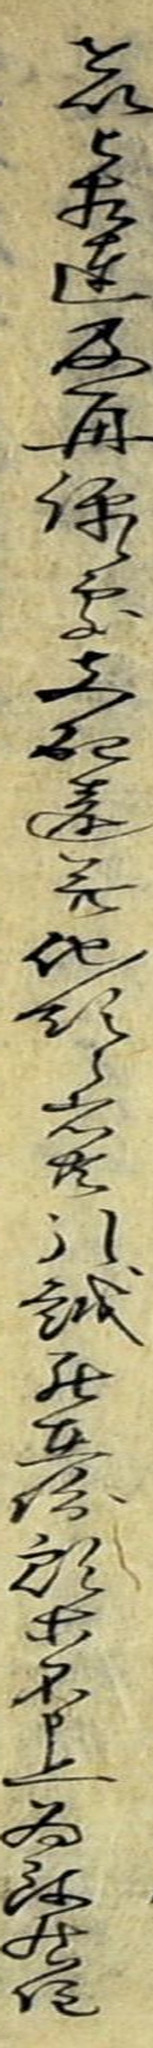を以被相達及再評候処支配違并他領之者共引越罷在儀願等不申上為致居住
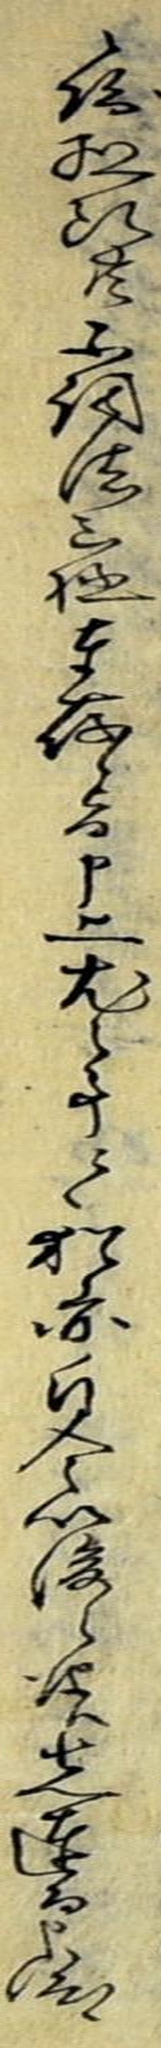候儀組頭共不調法至極奉存候旨申上尤之事ニ候猶亦自今以後之儀ハ先達而申渡候

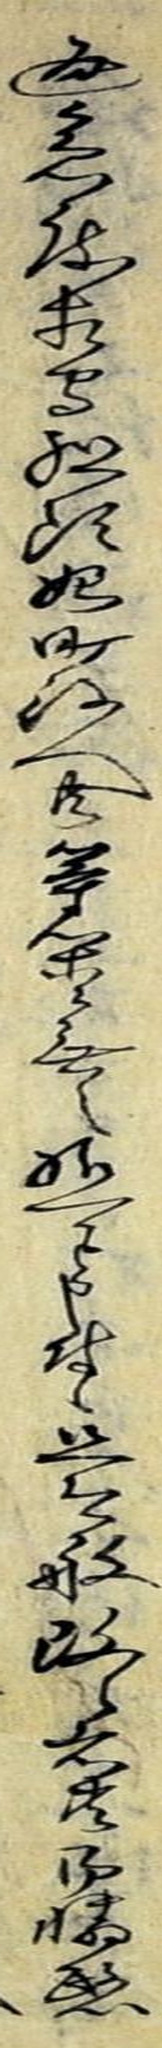通急度相守組頭始町役人共等閑ニ無之様可被申付候且今般改候者共御憐愍
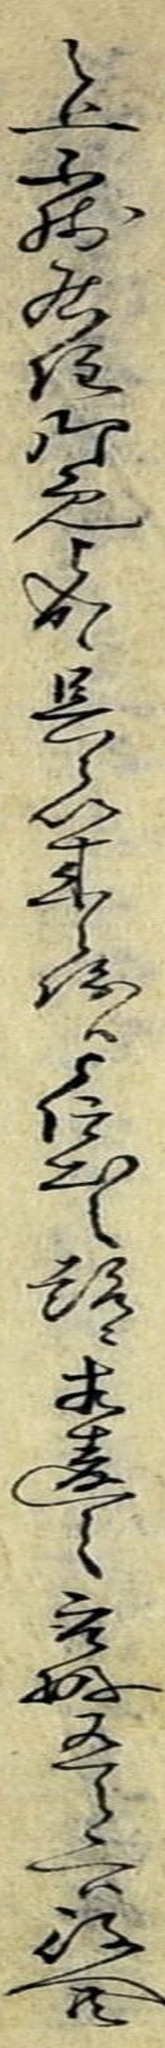之上不残居住御免被成候呉々以来之儀ハ被仰出候趣ニ相違之取扱有之候ヘハ役人共
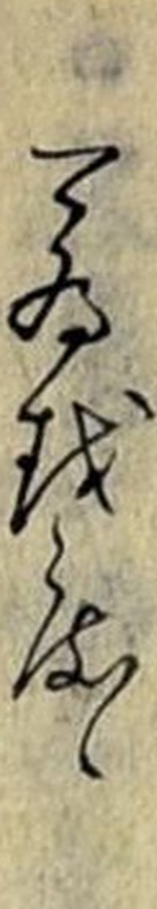可為越度候
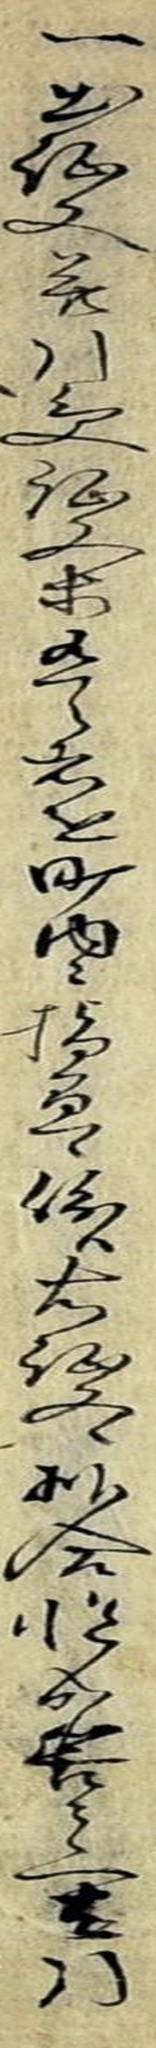一出証文并引受証文等有之者を町内ニ指置候儀ハ右証文へ掛合慥成筈ニ候へ共引
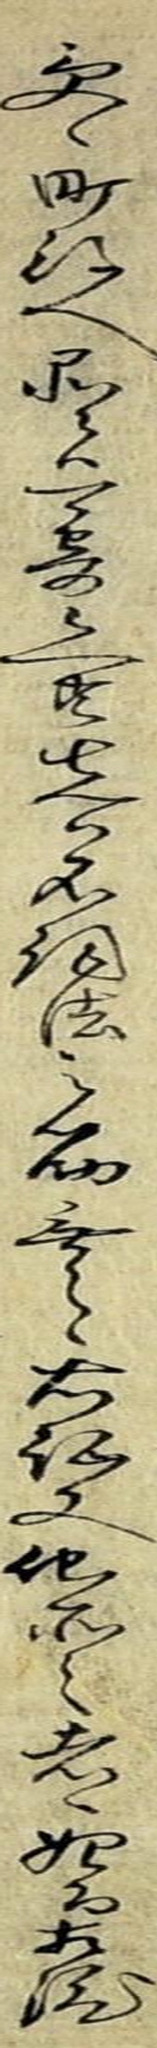受候町役人品ニハ可寄候へ共先ハ不調法之筋無之候右証文他所之者へ始而相渡
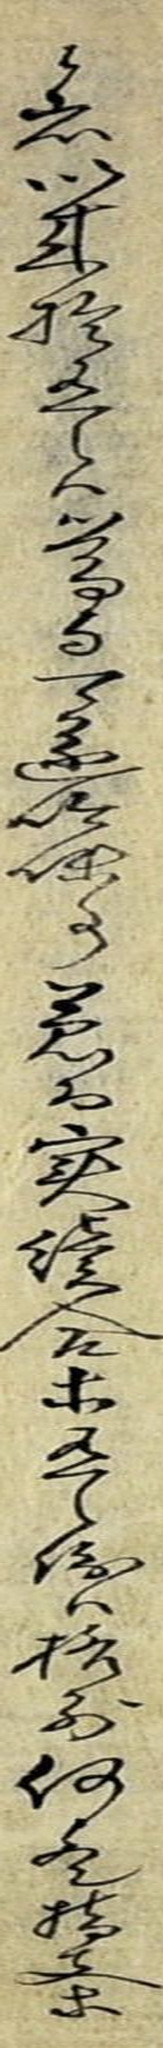候者以来於有之ハ篤与可遂吟味事兼而実続合等有之儀ハ格別何歟指支等
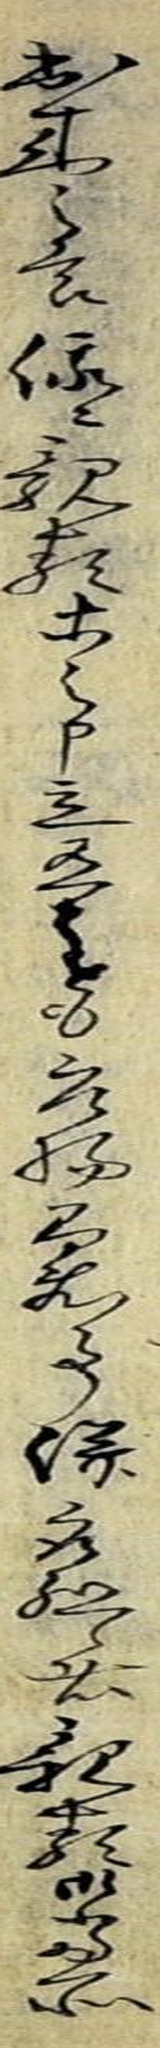出来之節俄ニ親類等之申立有之とも取揚間敷事併取組候者親類御当所
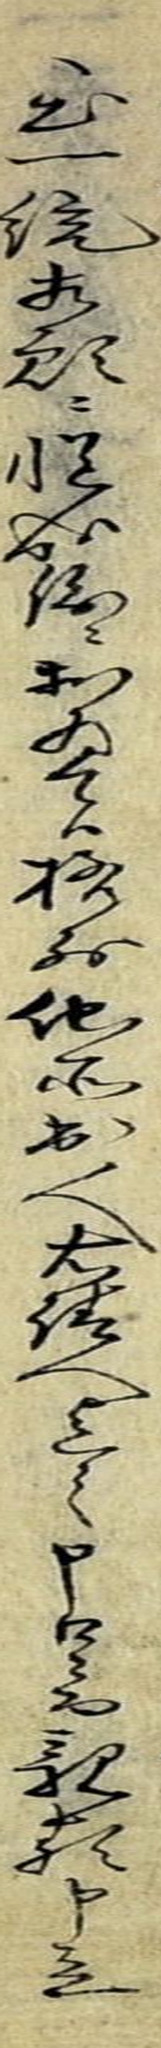へ出一統相願ニ慥成儀ニおゐてハ格別他所出人右請人迄之申口ニ而親類申立
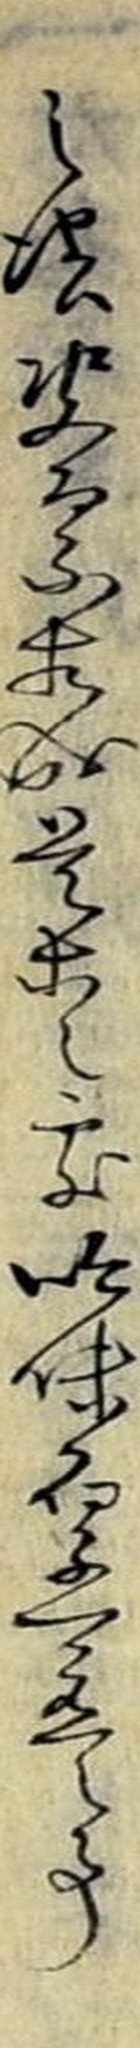之儀ハ決而不相成是等之処吟味厚可有之事
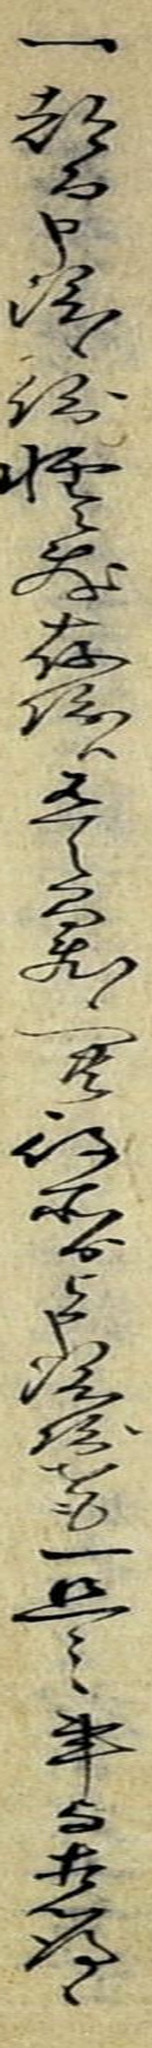一都而申渡候儀軽々敷存儀ハ有之間敷候へ共役所ゟ被申渡儀をも一旦々事与相心得候
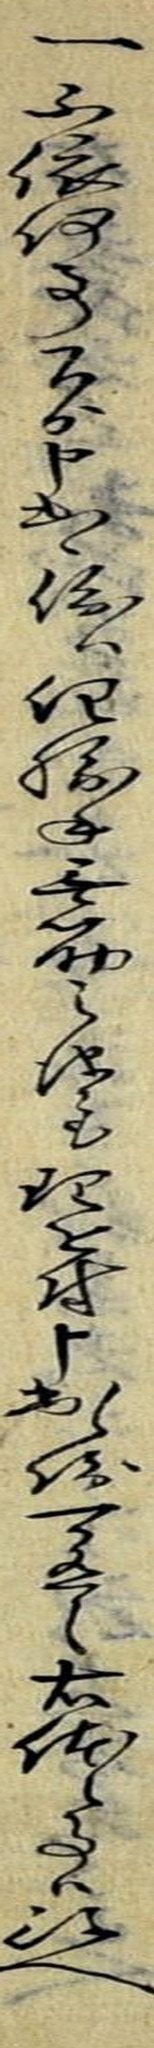一不依何事下ゟ申出候儀ハ任勝手無筋之儀ニも理を付申出候儀可有之右体之事ハ役人
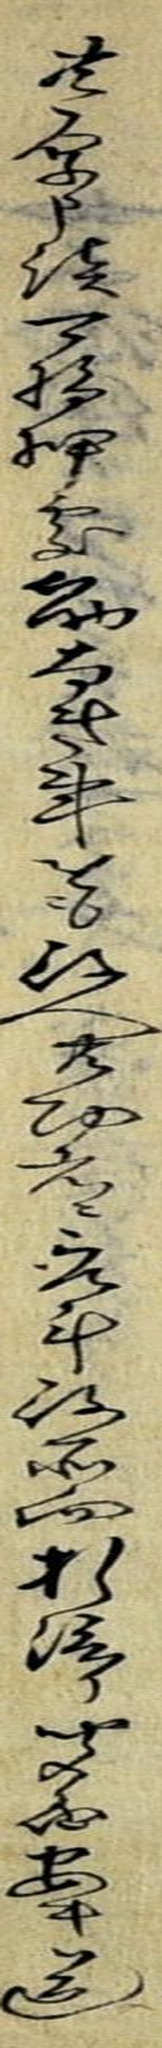共厚申談可指押処筋なき事をも役人共功者ニ取計役所向打渡り聞届安キ道
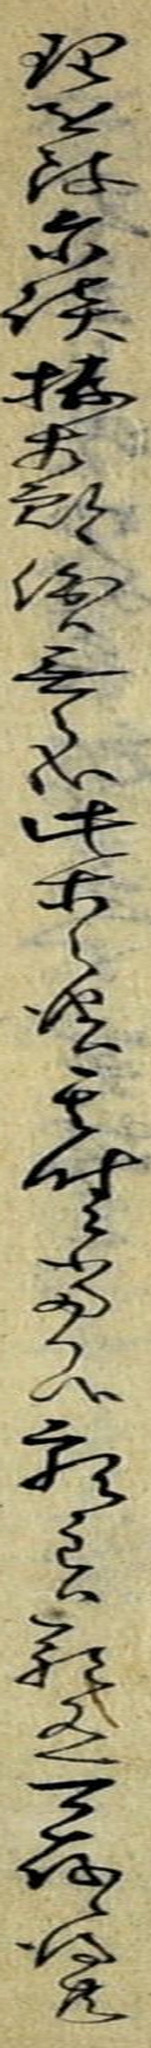理を致示談拵相願候儀ハ無之哉此等之儀ハ其時ニ当り候願主ハ難有可存候得共
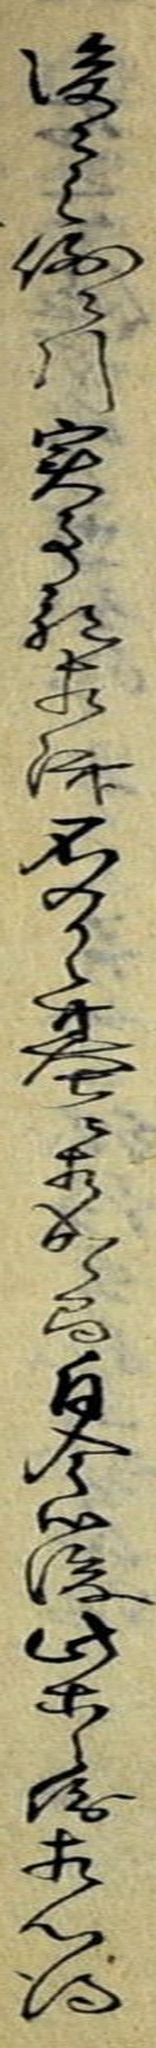後々之例ニ引実事難相済不〆り之基ニ相成候自今以後此等之儀相心得
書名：命令之部 三
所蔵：福井県文書館 Fukui Prefectural Archives
